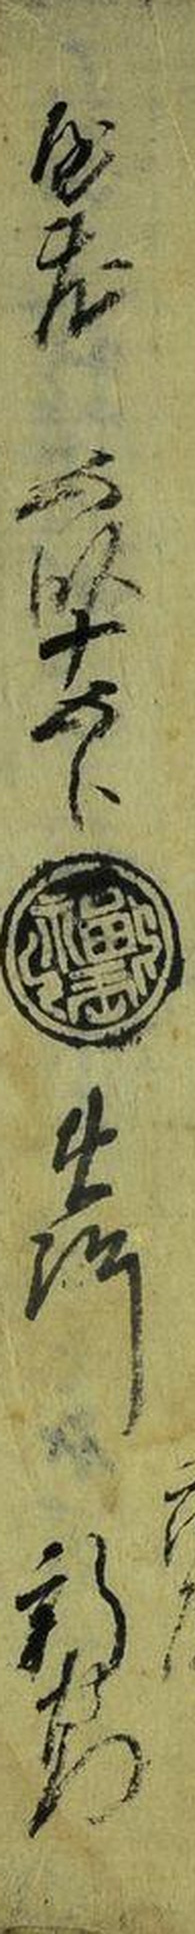屋敷五畝十五歩㊞免許新左衛門
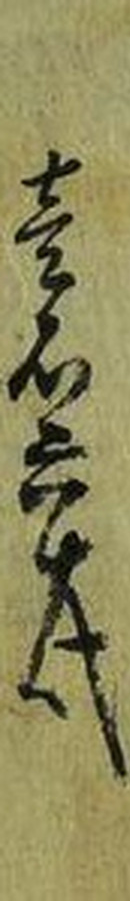一石六斗代
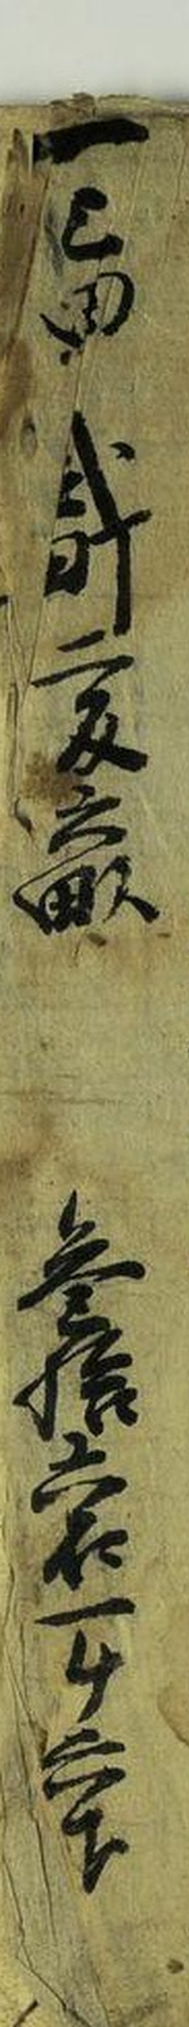一上田弐町二反六畝参拾六石一斗六升
